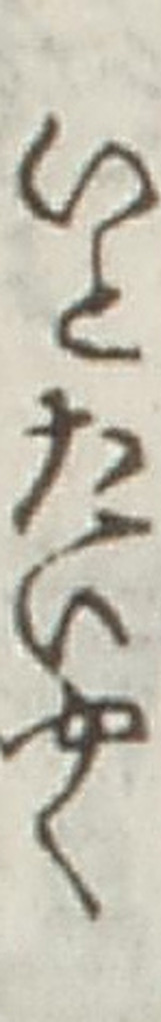いとたいやく

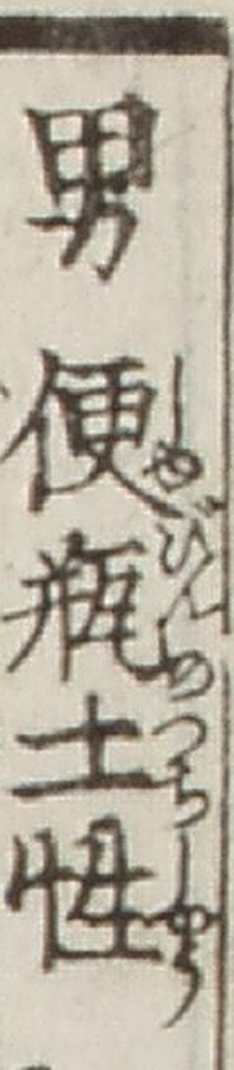男便瓶土性
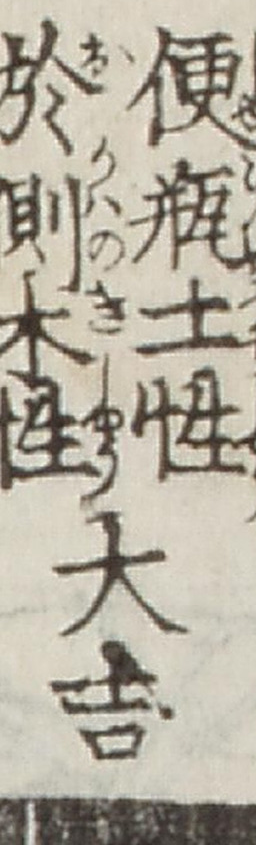女於側木性大吉
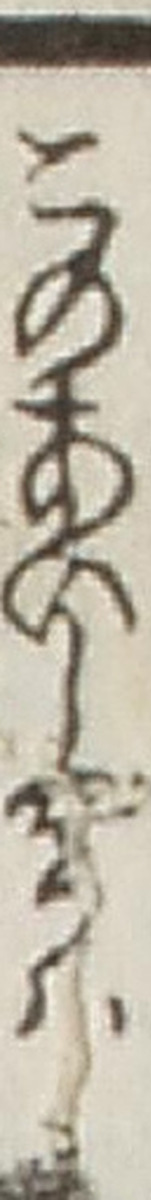このあいしやうは
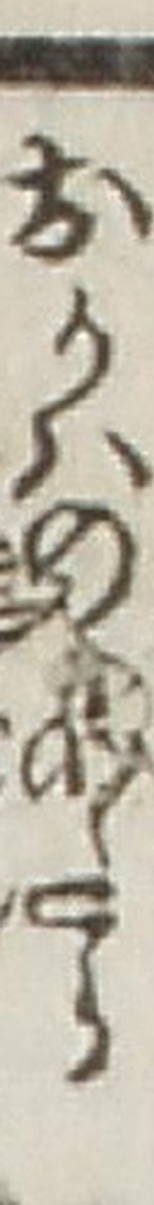おかはのあたら
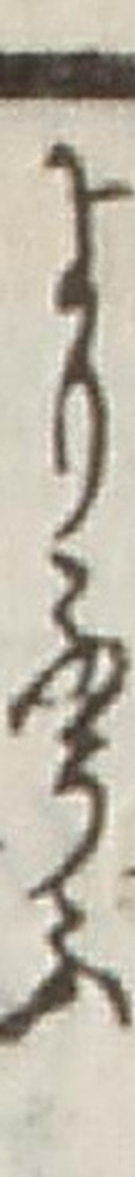よりふうふ
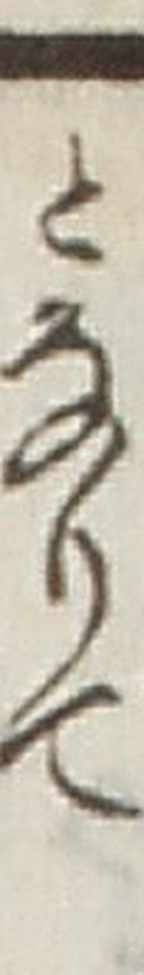となりて
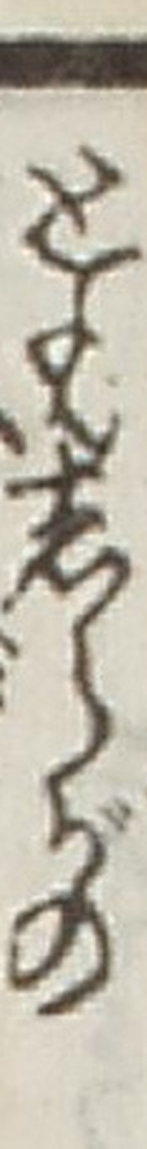ともしらがの
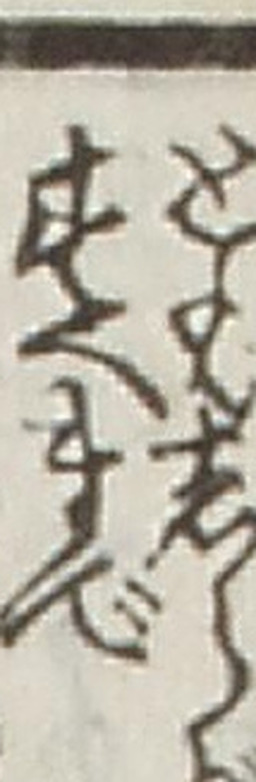すへまで
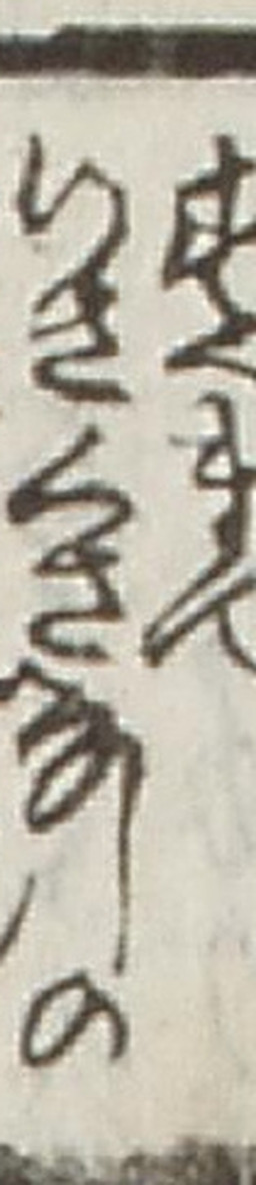いきくさなしの
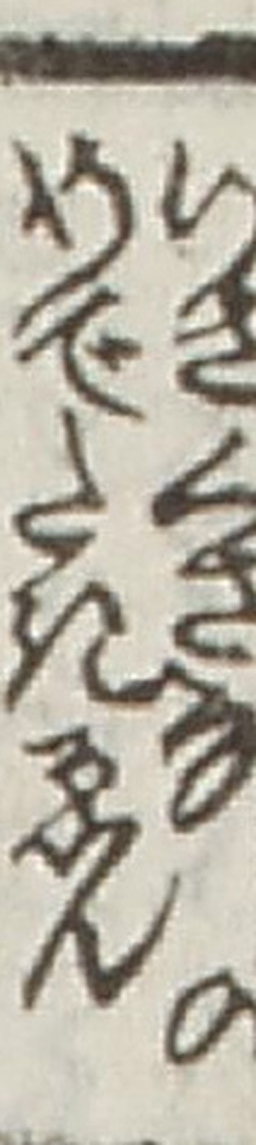めでたきゑん
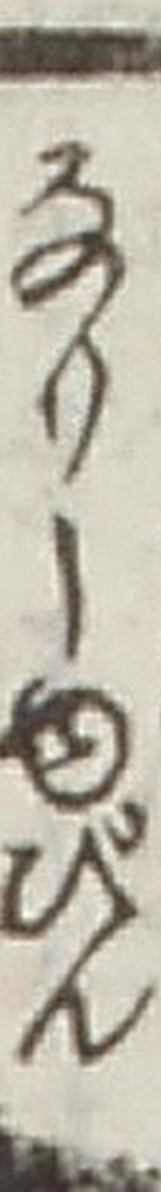なりしゆびん
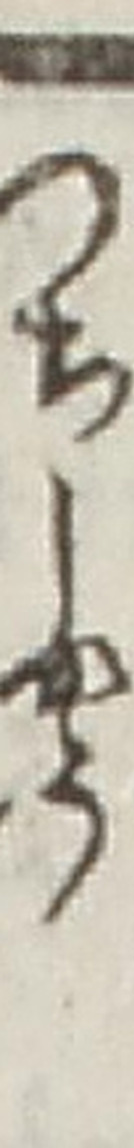つちしやう
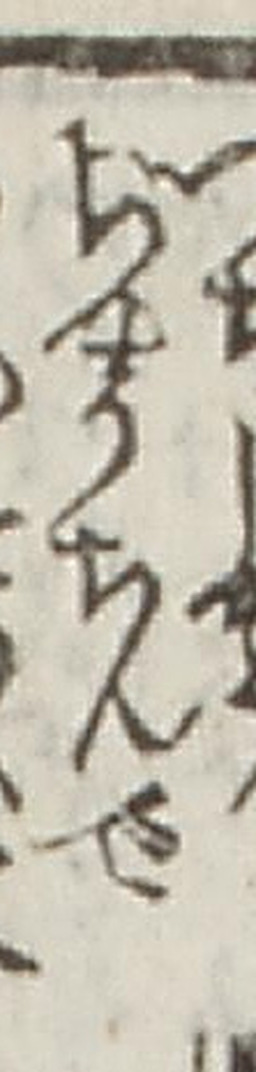ぢやうちんで
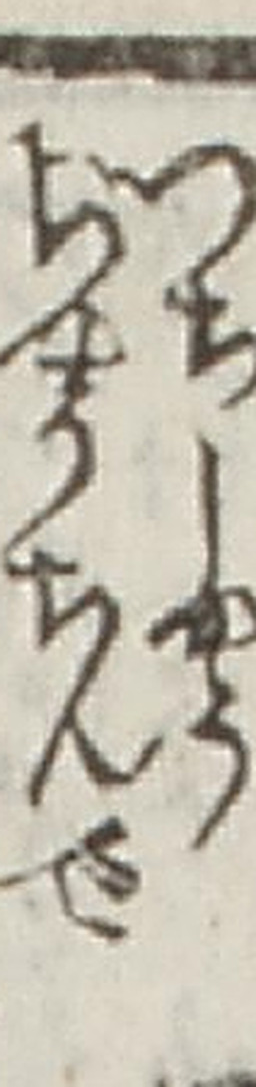ぢやうちんで
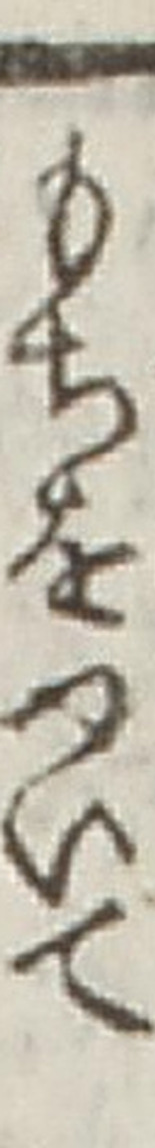もちをついて
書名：三世相出雲當座帳　上下冊
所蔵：東京大学地震研究所図書室 Earthquake Research Institute Library, The University of Tokyo, JAPAN
